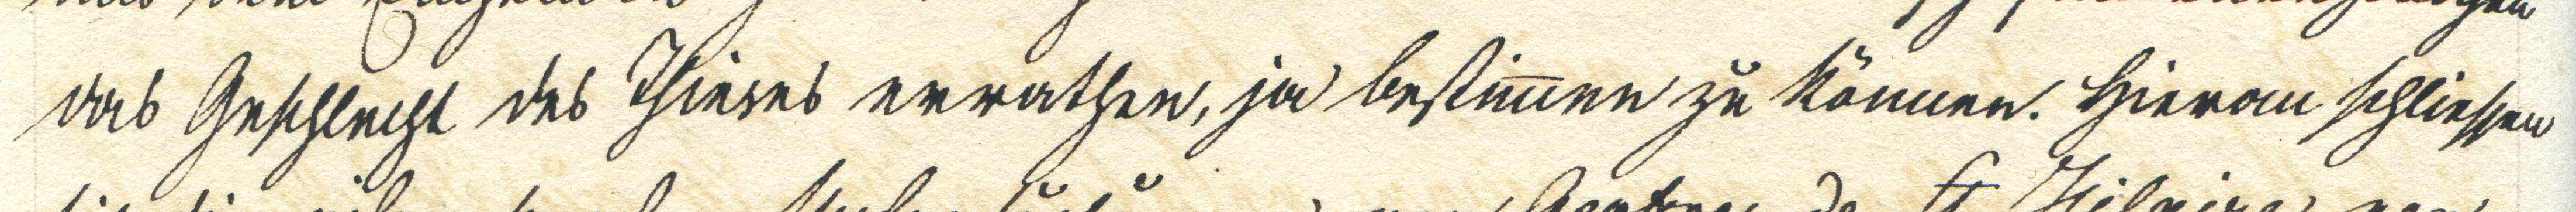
das Geschlecht des Thieres errathen, ja bestim̃en zu können. Hieran schliessen
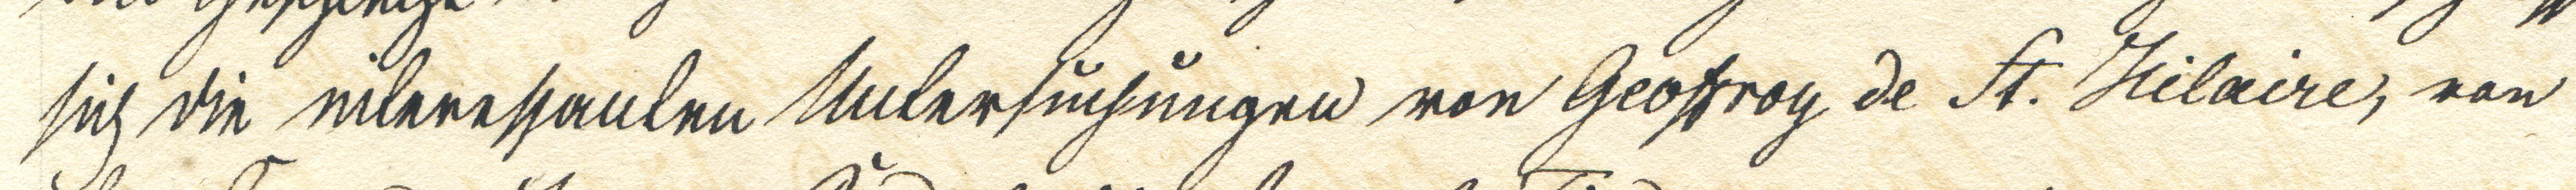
sich die interessanten Untersuchungen von Geoffroy de St. Hilaire, von
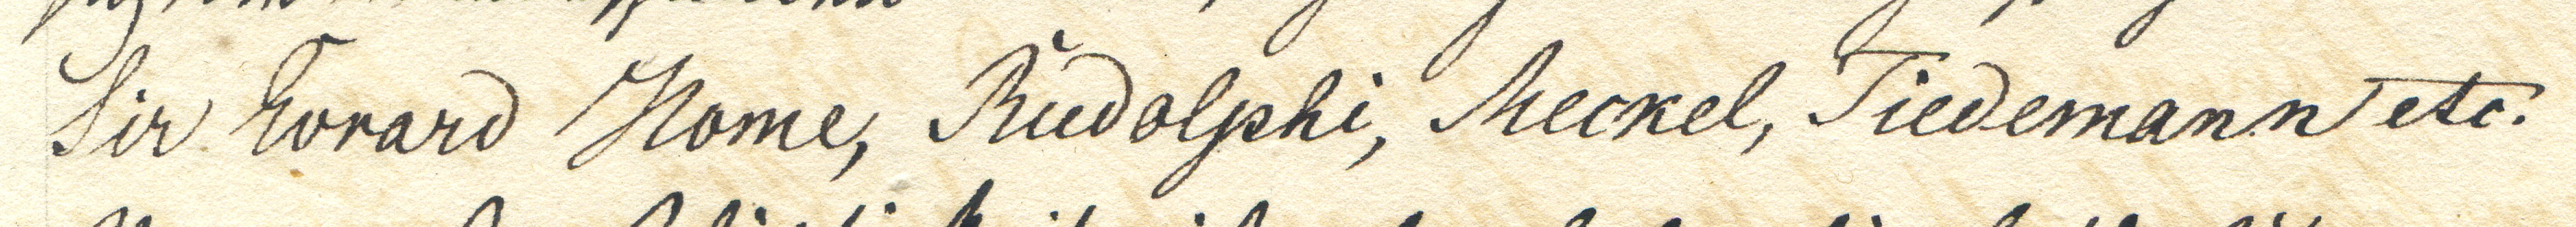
Sir Evrard Home, Rudolphi, Meckel, Tiedemann etc.
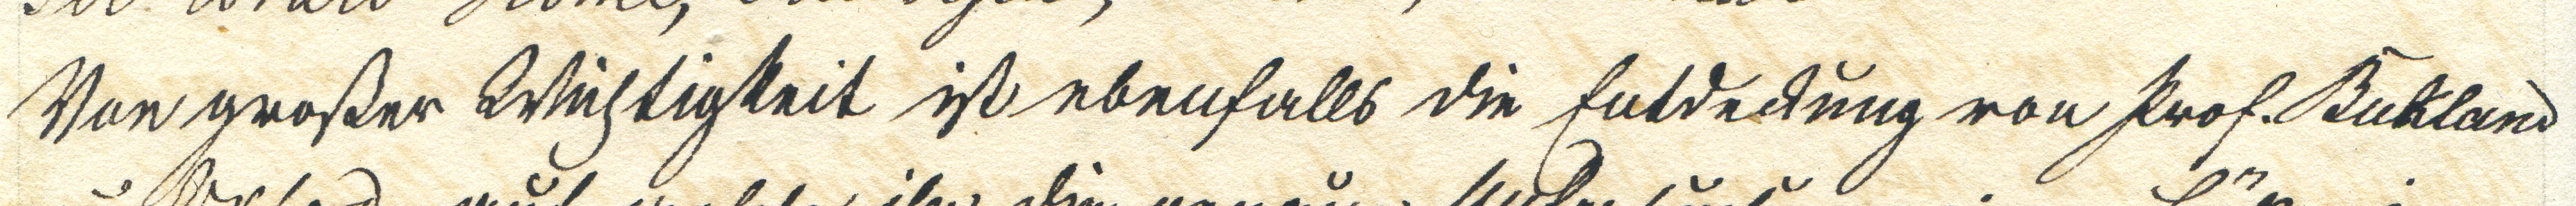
Von großer Wichtigkeit ist ebenfalls die Entdeckung von Prof. Bukland
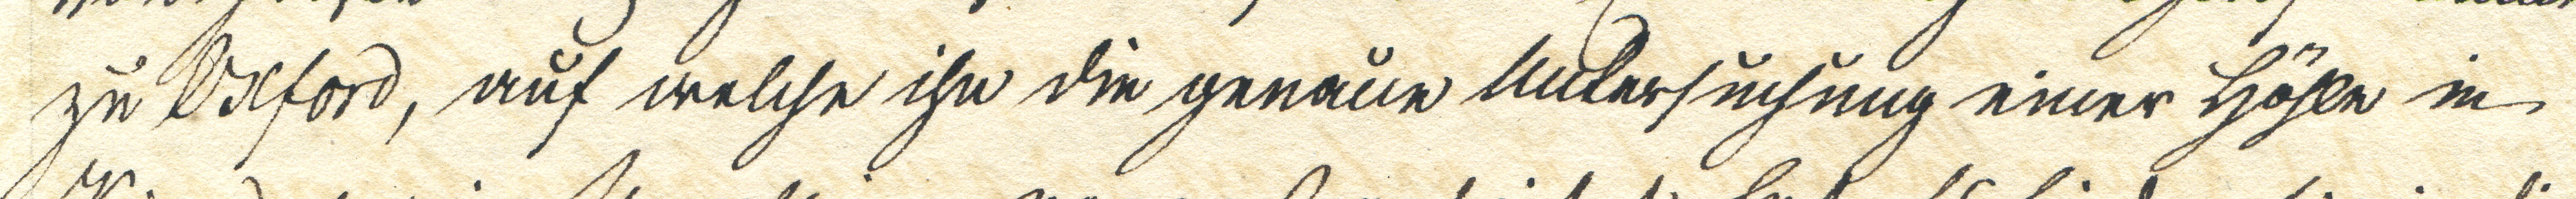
zu Oxford, auf welche ihn die genaue Untersuchung einer Höhle in
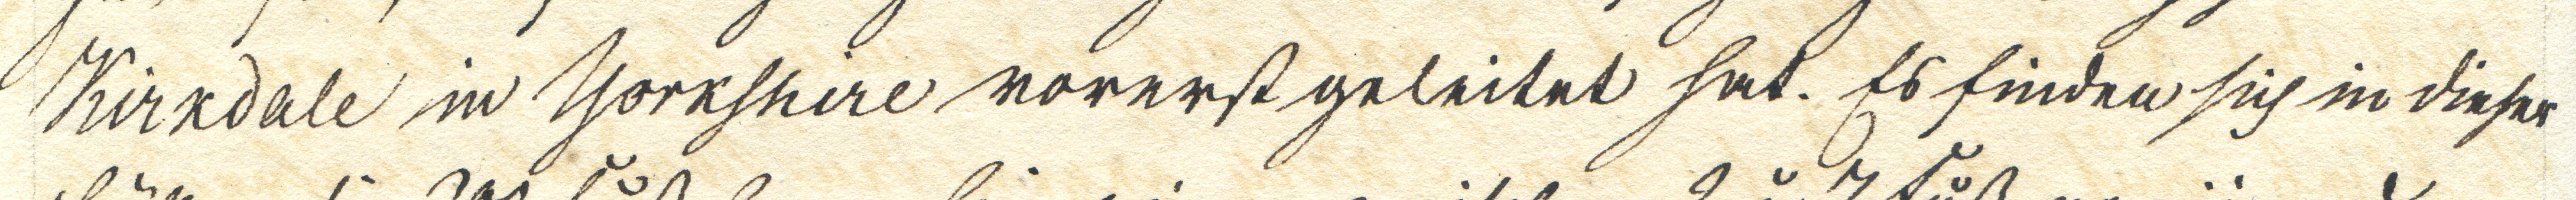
Kirkdale in Yorkshire vorerst geleitet hat. Es finden sich in dieser
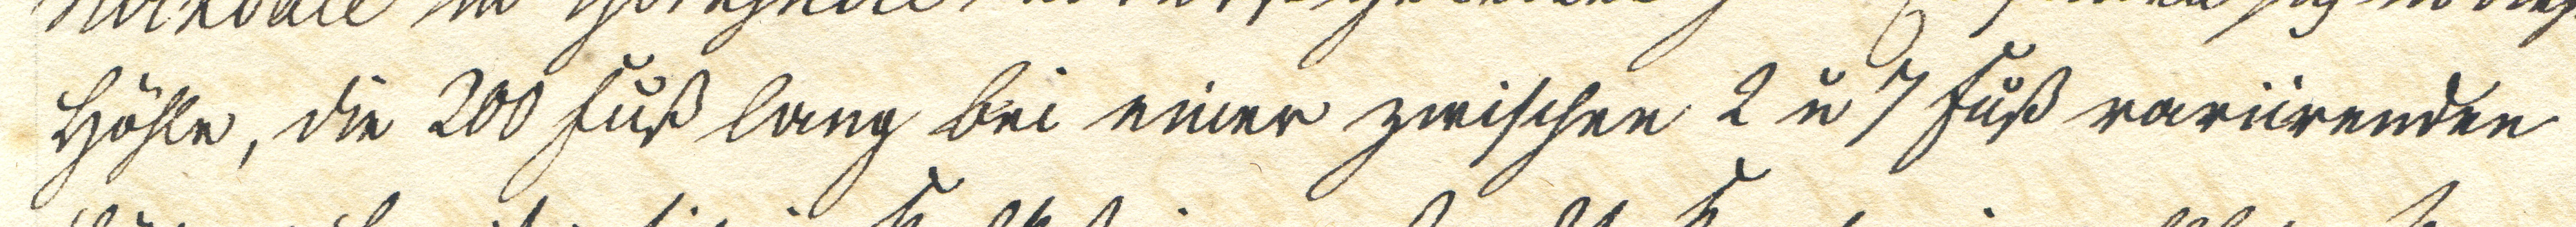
Höhle, die 200 Fuß lang bei einer zwischen 2 u 7 Fuß variirenden
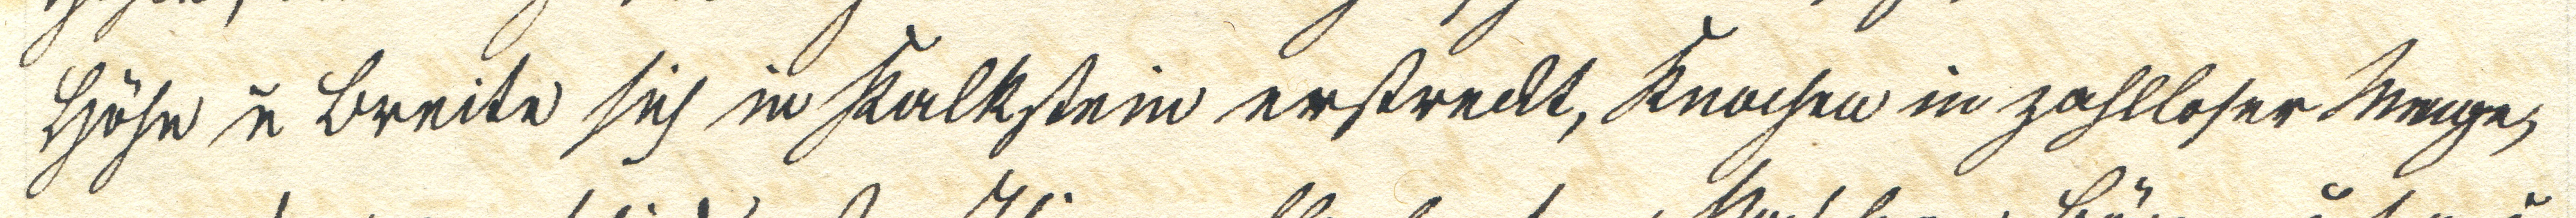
Höhe u Breite sich in Kalkstein erstreckt, Knochen in zahlloser Menge,
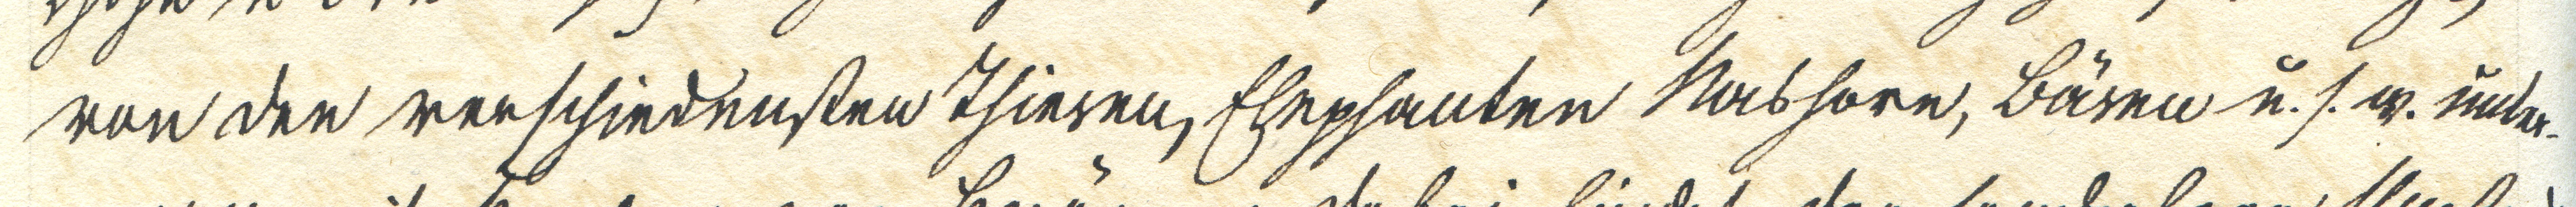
von den verschiedensten Thieren, Elephanten, Nashorn, Bären u. s. w. unter-
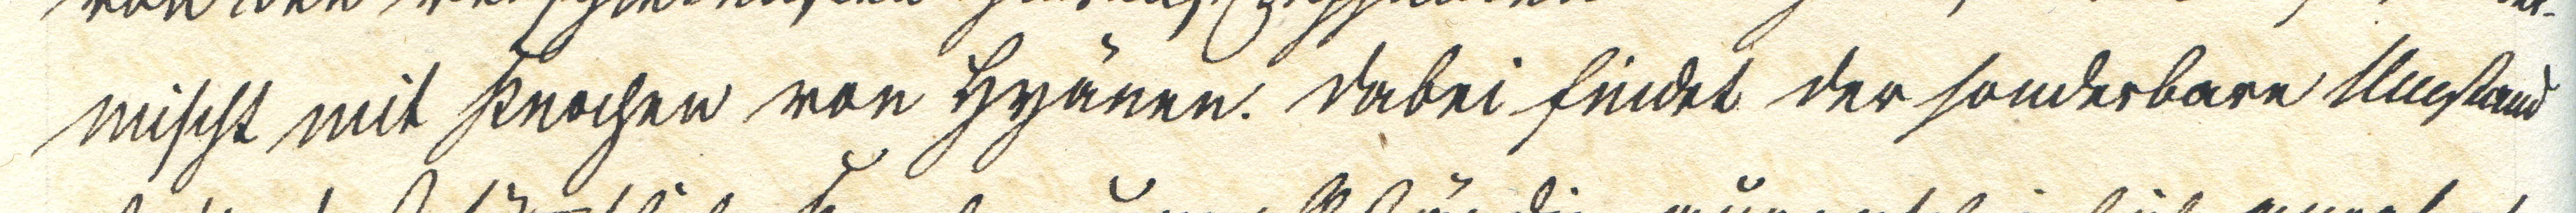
mischt mit Knochen von Hyänen. Dabei findet der sonderbare Umstand
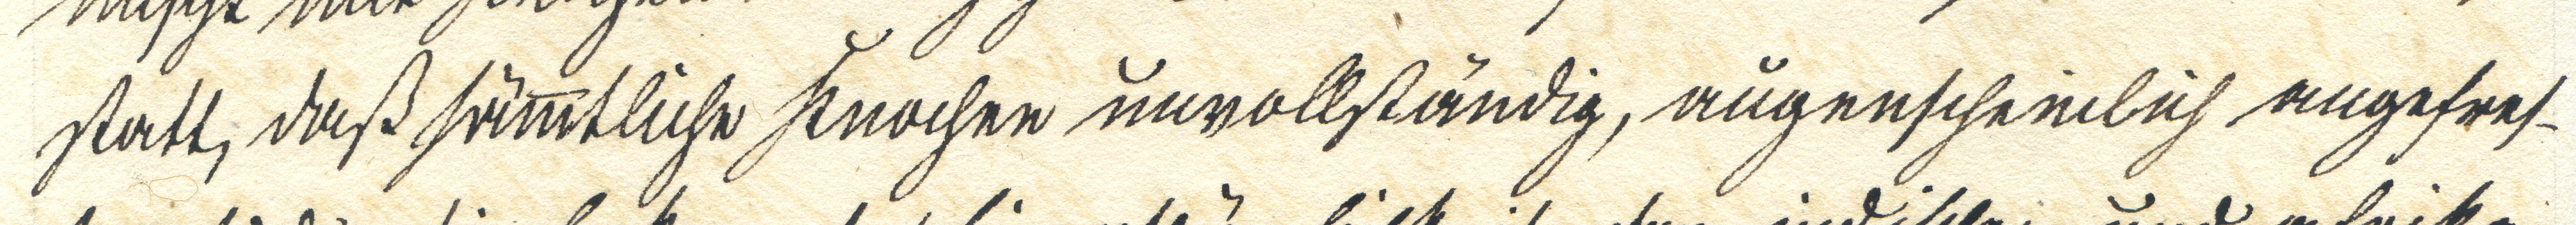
statt, daß säm̃tliche Knochen unvollständig, augenscheinlich angefres-
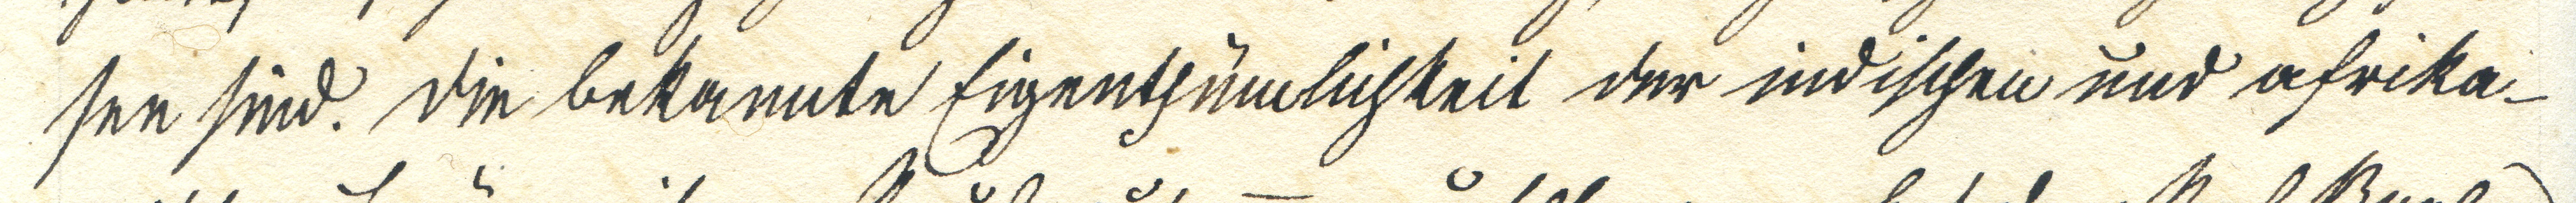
sen sind. Die bekannte Eigenthümlichkeit der indischen und afrika-
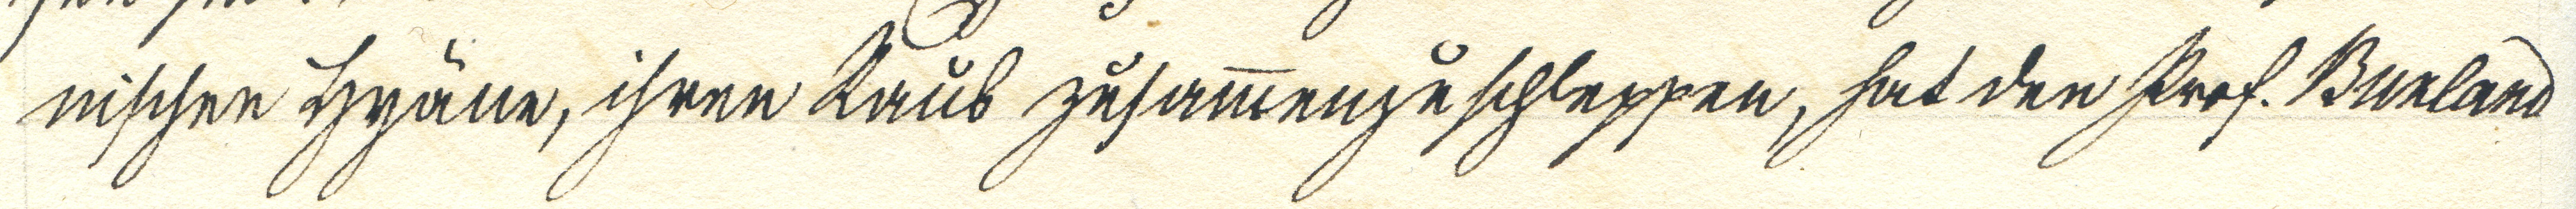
nischen Hyäne, ihren Raub zusam̃enzuschleppen, hat den Prof. Bukland
